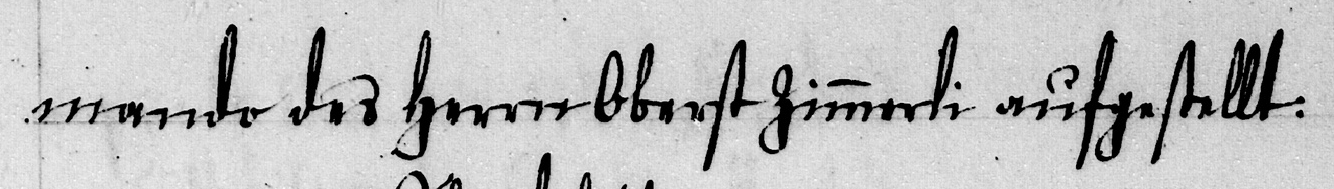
mando des Herrn Oberst Zimmerli aufgestellt:
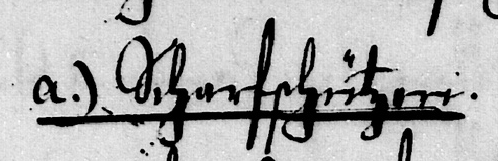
a.) Scharfschützen.
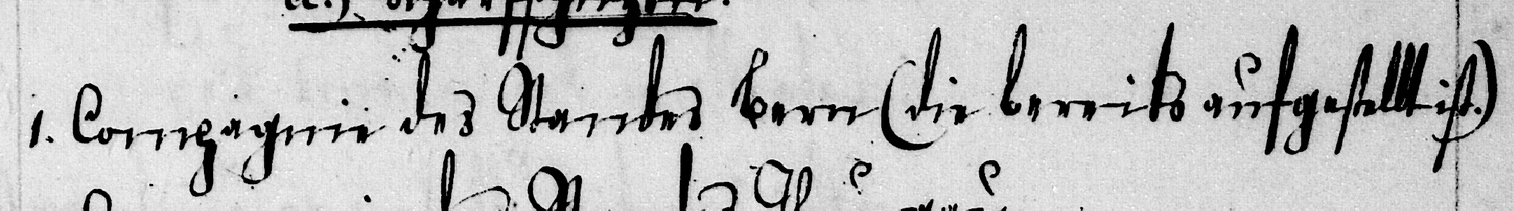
1. Compagnie des Standes Bern (die bereits aufgestellt
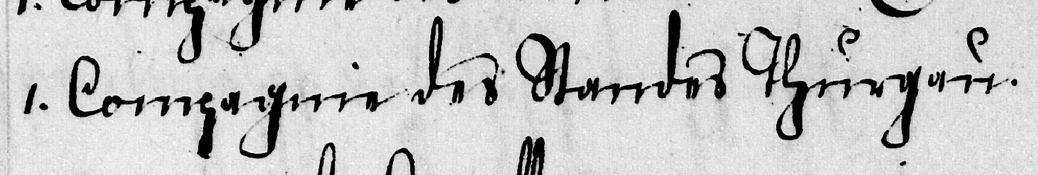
1. Compagnie des Standes Thurgau.
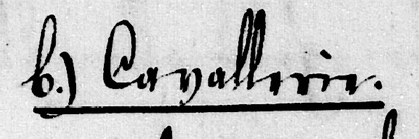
b.) Cavallerie.
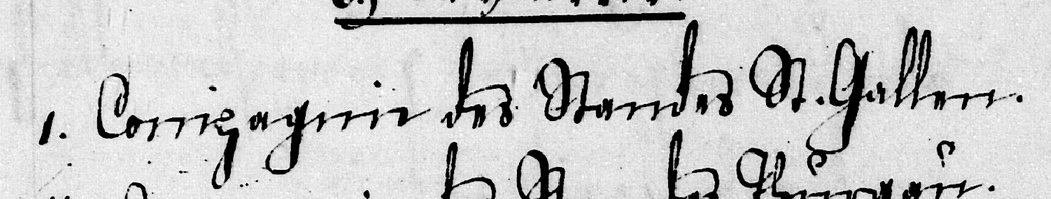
1. Compagnie des Standes St. Gallen.
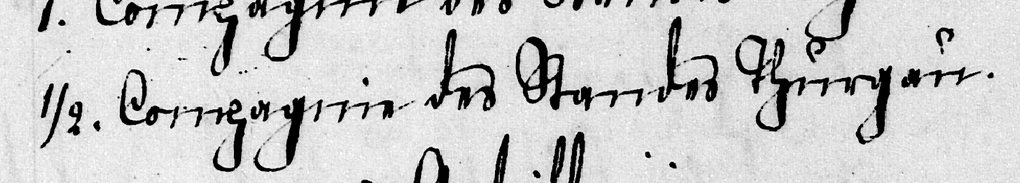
½ Compagnie des Standes Thurgau.
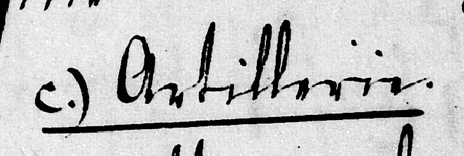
c.) Artillerie.
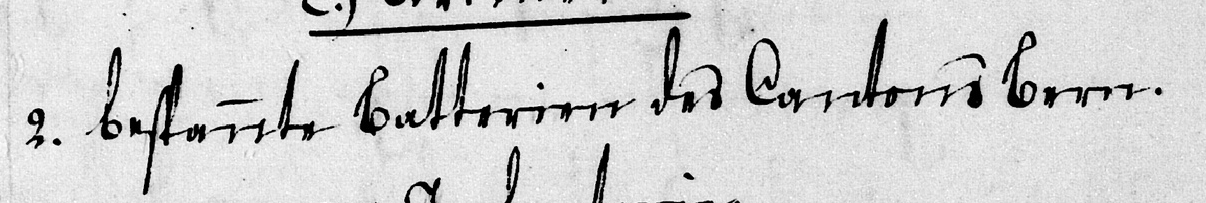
2. bespannte Batterien des Cantons Bern.
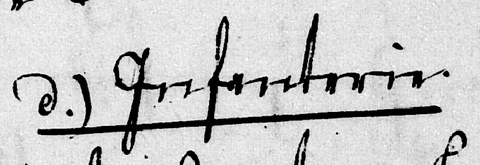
d.) Infanterie.
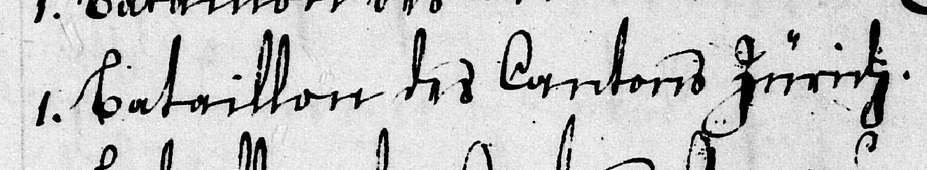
1. Bataillon des Cantons Zürich.
